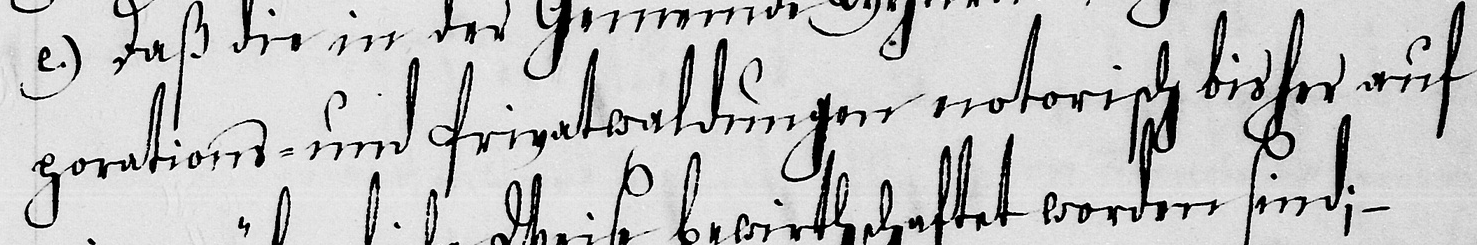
porations- und Privatwaldungen notorisch bisher auf
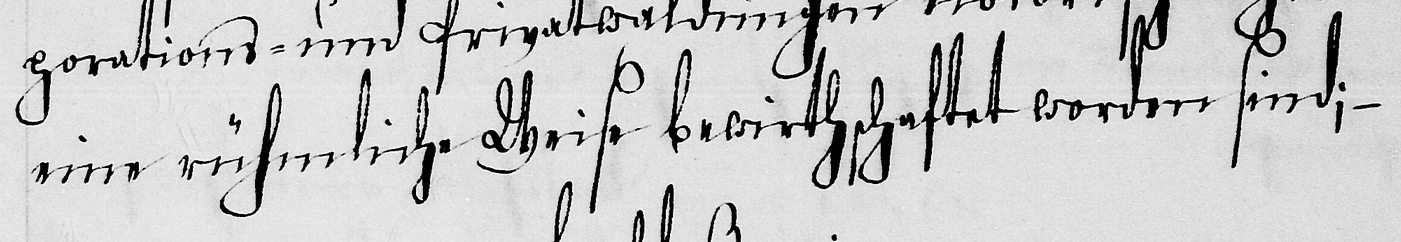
eine rühmliche Weise bewirthschaftet worden sind, –
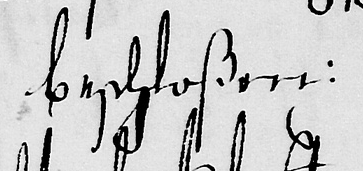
beschloßen:
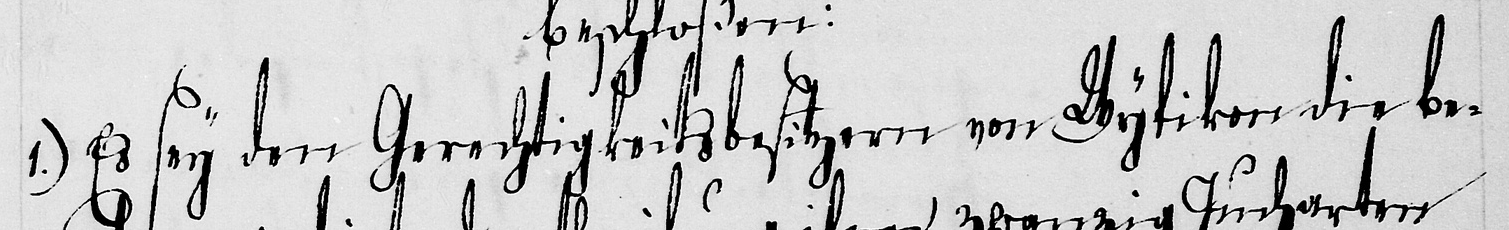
Es sey den Gerechtigkeitsbesitzern vom Wytikon die be¬
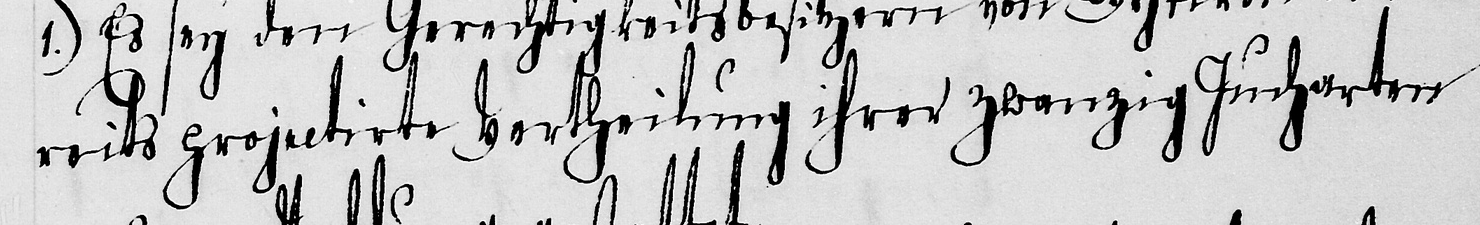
reits projectirte Vertheilung ihrer zwanzig Jucharten
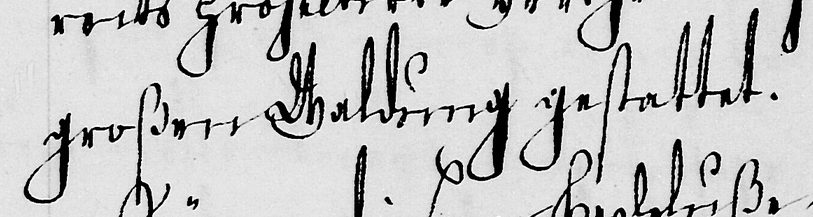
großen Waldung gestattet.
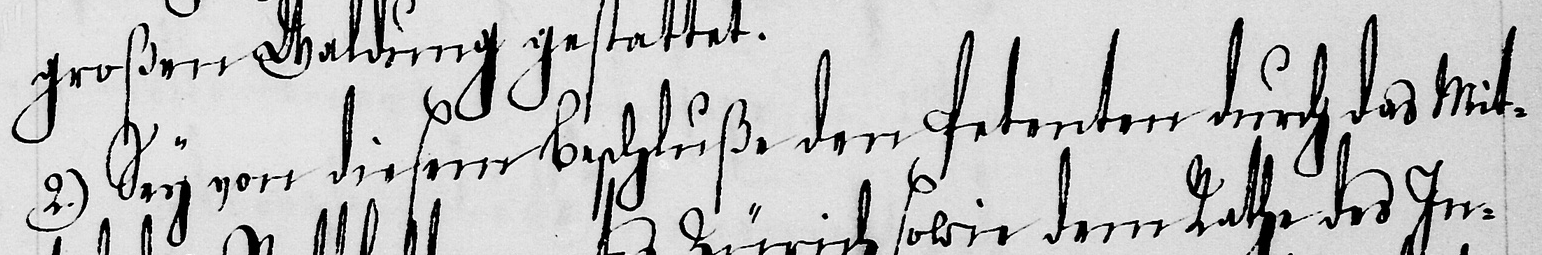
2.) Sey von diesem Beschluße den Petenten durch das Mit¬
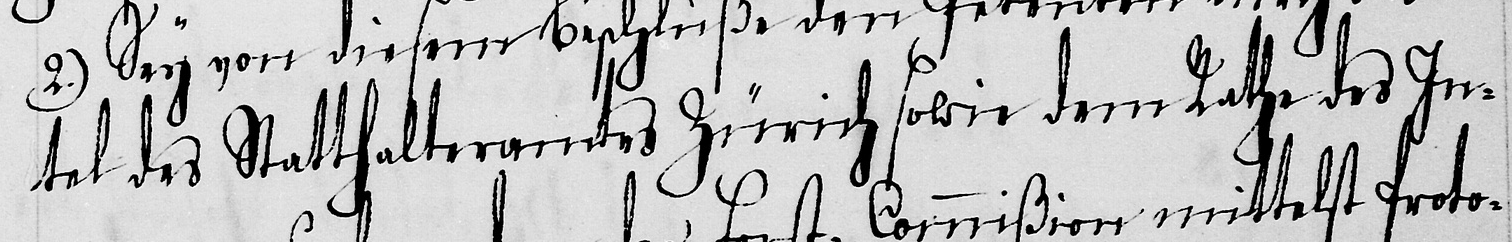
tel des Statthalteramtes Zürich sowie dem Rathe des In¬
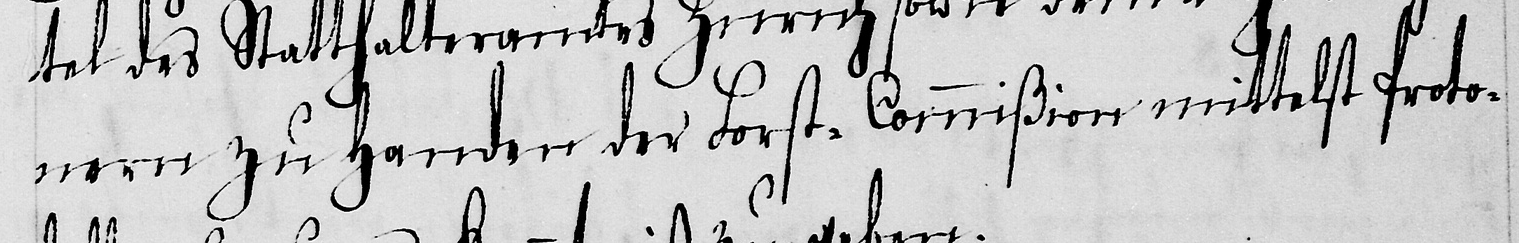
nern zu Handen der Forst-Commißion mittelst Proto¬
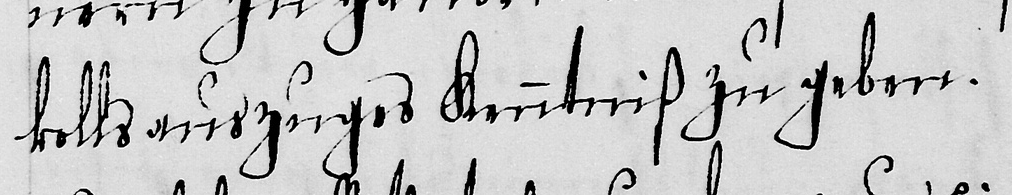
kollsauszuges Kenntniß zu geben.
